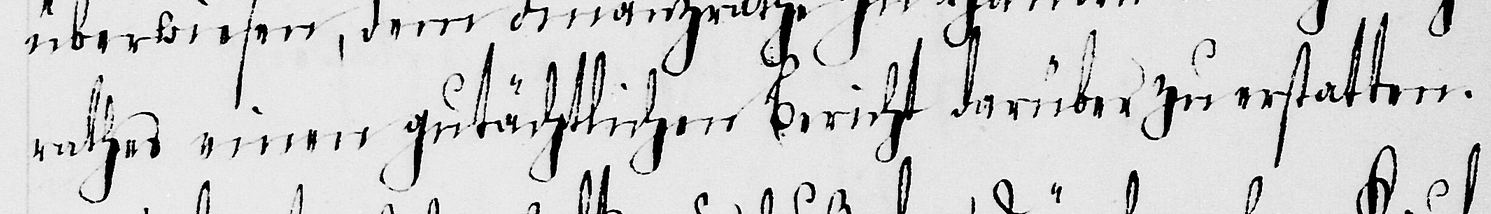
rathes einen gutächtlichen Bericht darüber zu erstatten.
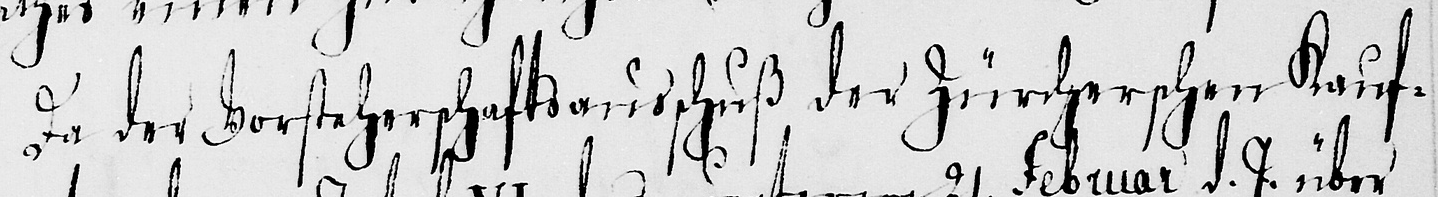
Da der Vorsteherschaftsausschuß der Zürcherschen Kauf¬
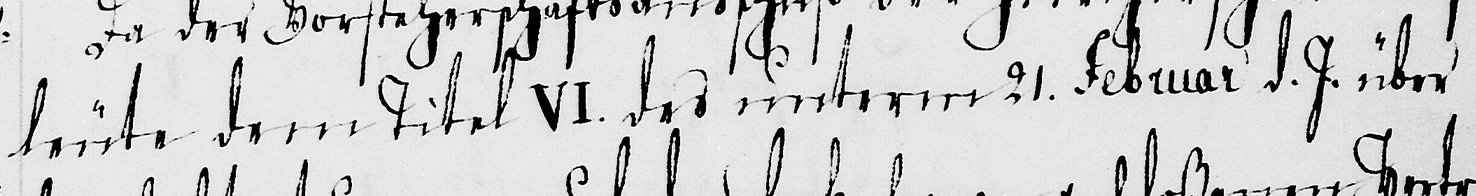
leute dem Titel VI. des unterm 21. Februar d. J. über
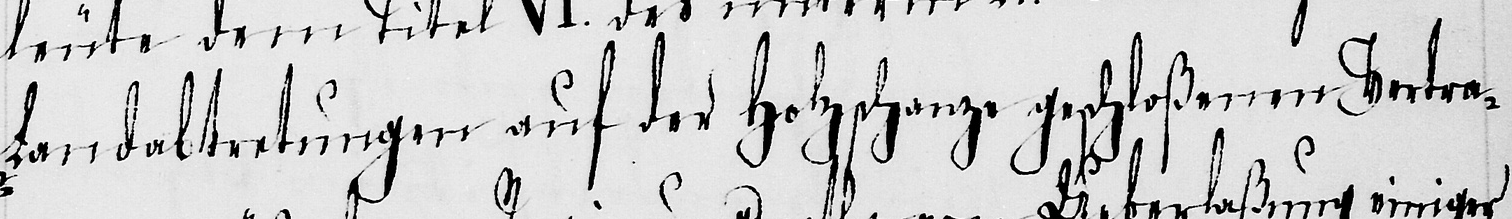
Landabtretungen auf der Holzschanze geschloßenen Vertr¬
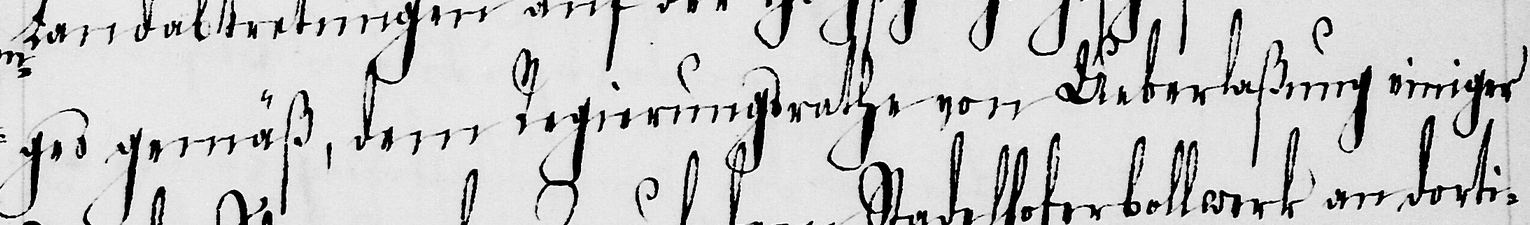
ages gemäß, dem Regierungsrathe von Ueberlaßung einiger
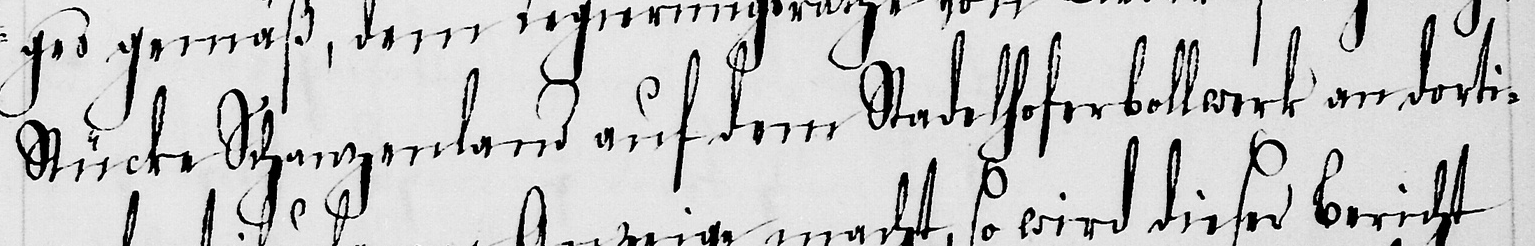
Stücke Schanzenland auf dem Stadelhoferbollwerk an dort¬
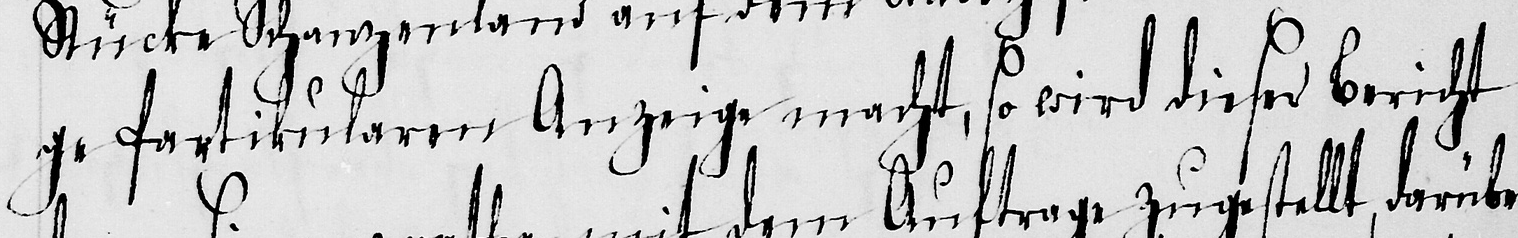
ige Particularen Anzeige macht, so wird dieser Bericht
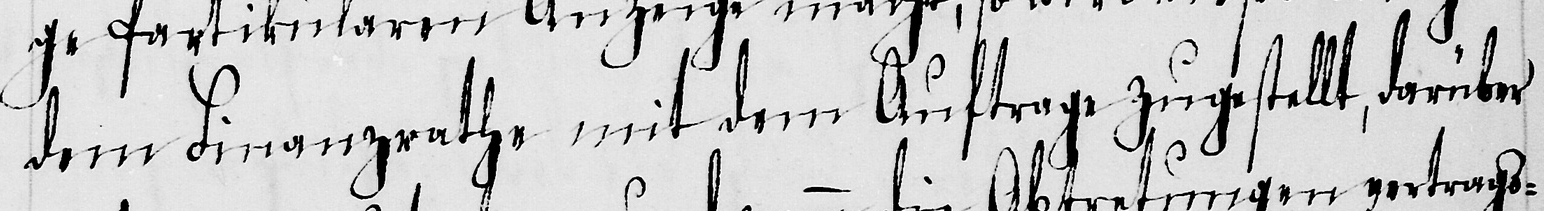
dem Finanzrathe mit dem Auftrage zugestellt, darü¬
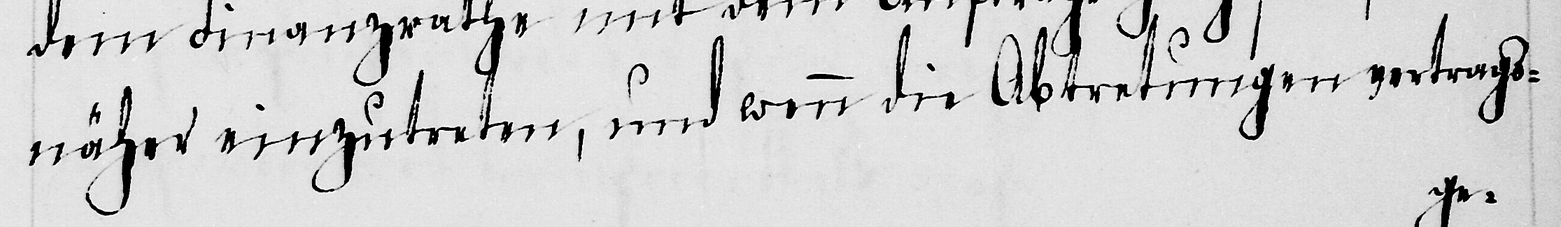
näher einzutreten, und wenn die Abtretungen vertrags-
